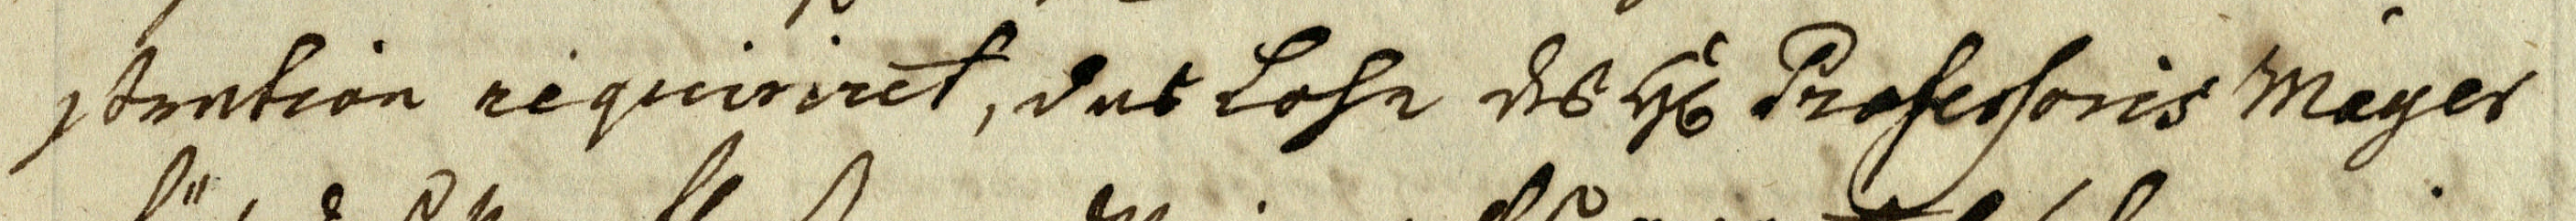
stration requiriret, das Lohn des H. Professoris Maÿer
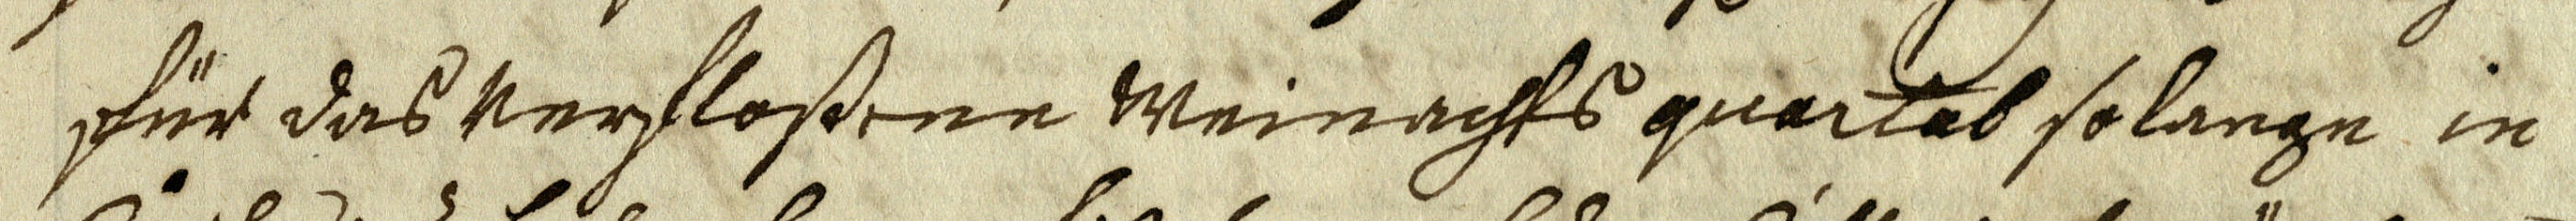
für das verfloßene Weinachtsquartal solange in
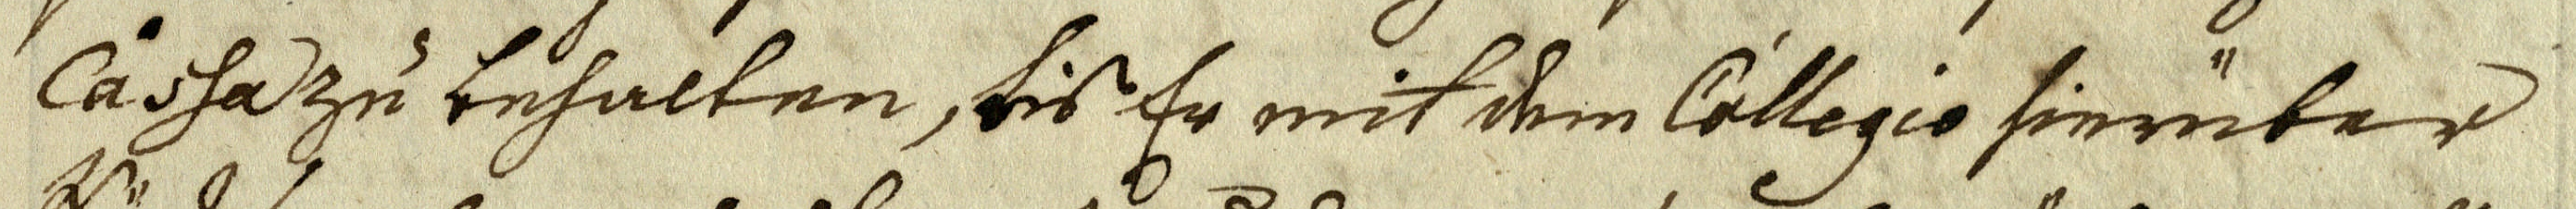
Cassa zu behalten, bis Er mit dem Collegio hierüber
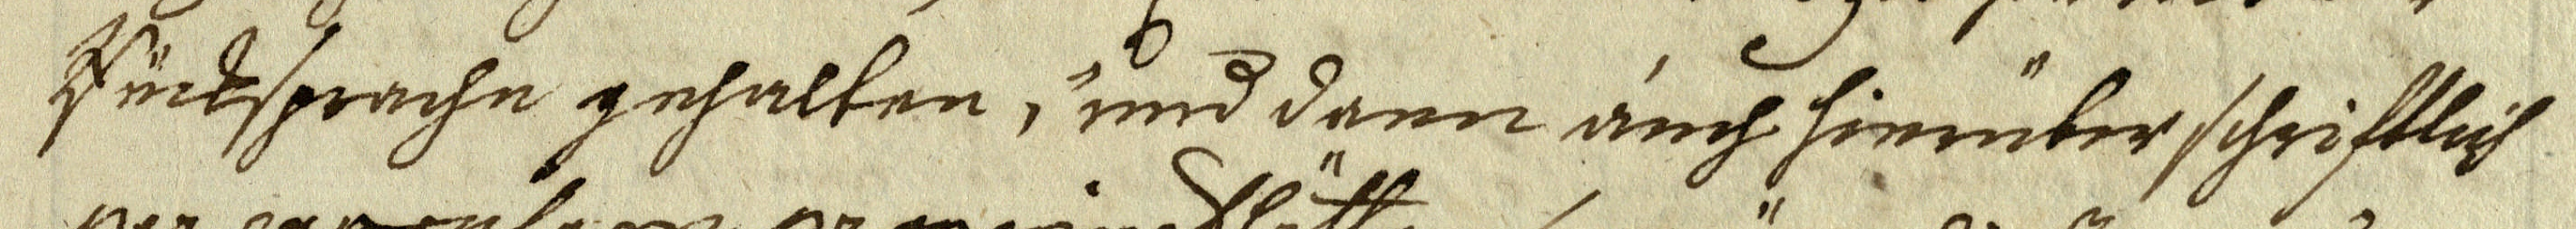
Rücksprache gehalten, und dann auch hierüber schriftlich
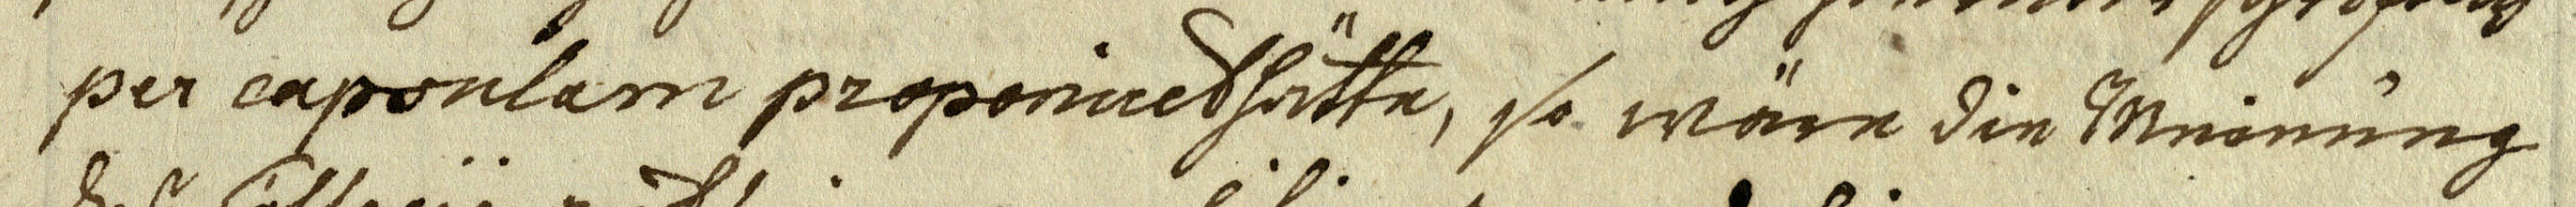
per capsulam proponiret hätte, so wäre die Meinung
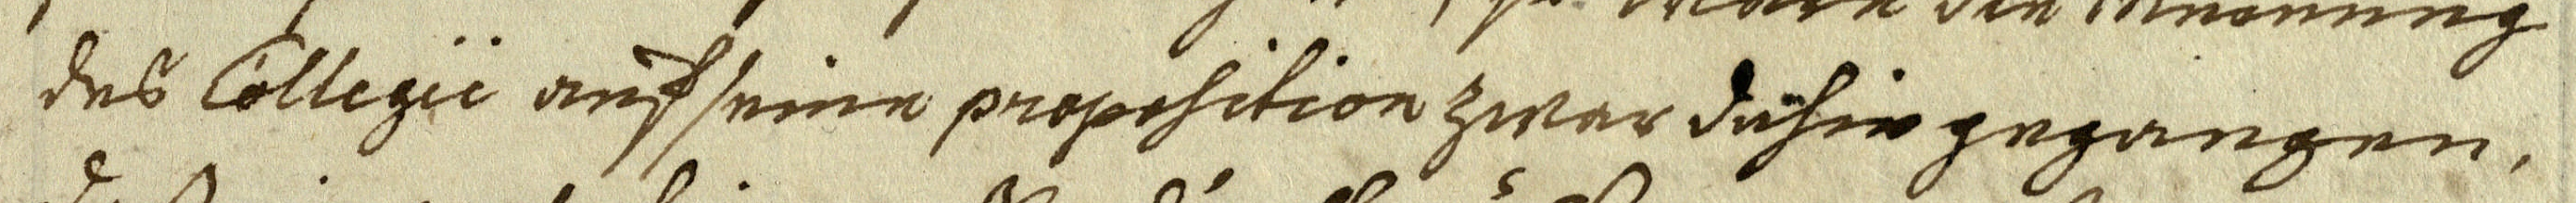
des Collegii auf seine proposition zwar dahin gegangen,
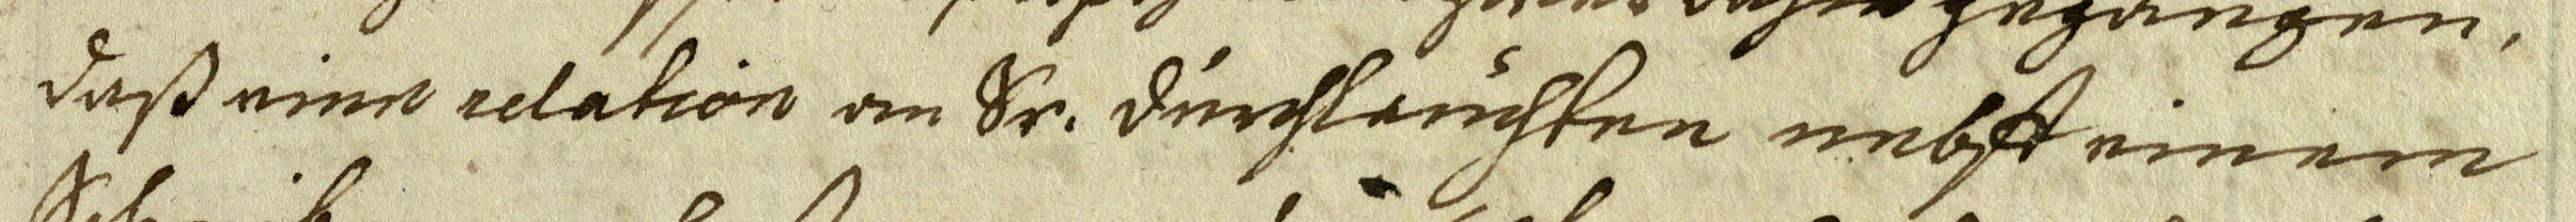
daß eine relation an Sr. Durchlauchten nebst einem
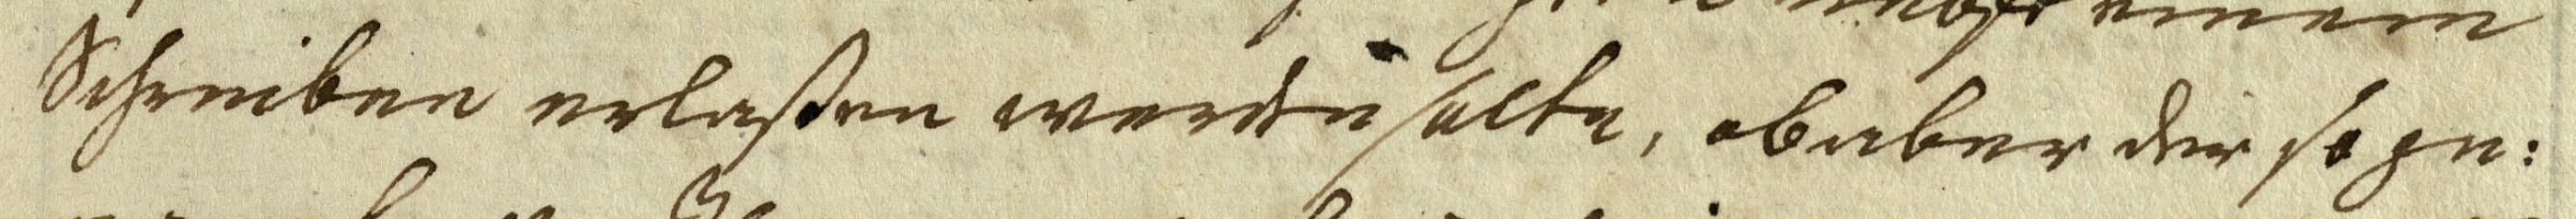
Schreiben erlaßen werden solte, ob aber der so ge¬
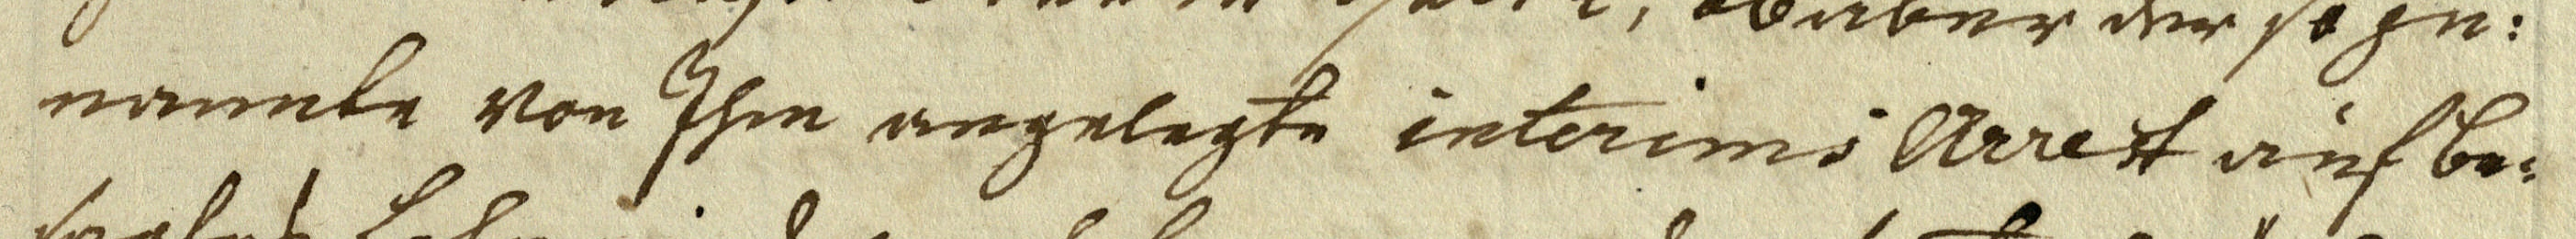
nannte von Ihm angelegte interims Arrest auf be¬
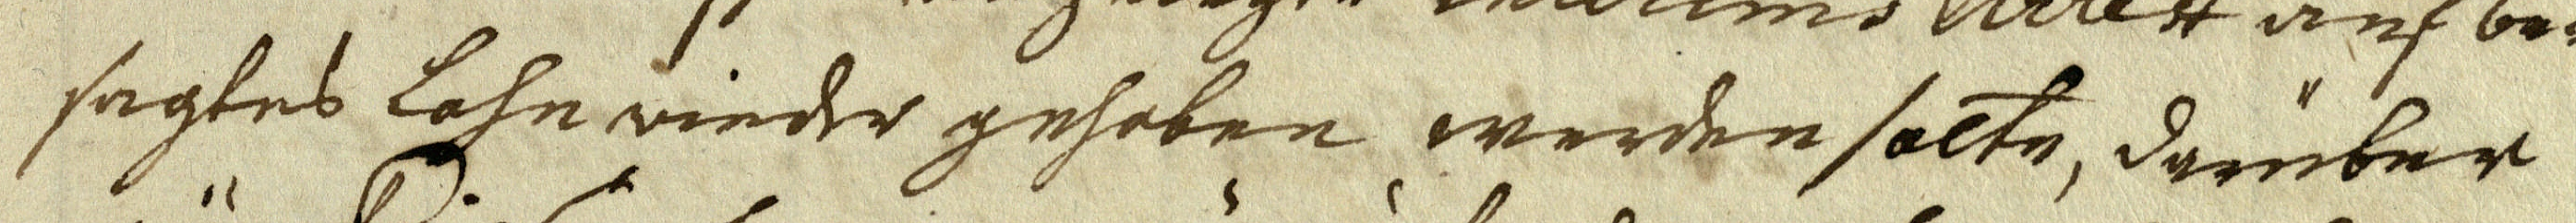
sagtes Lohn wieder gehoben werden solte, darüber
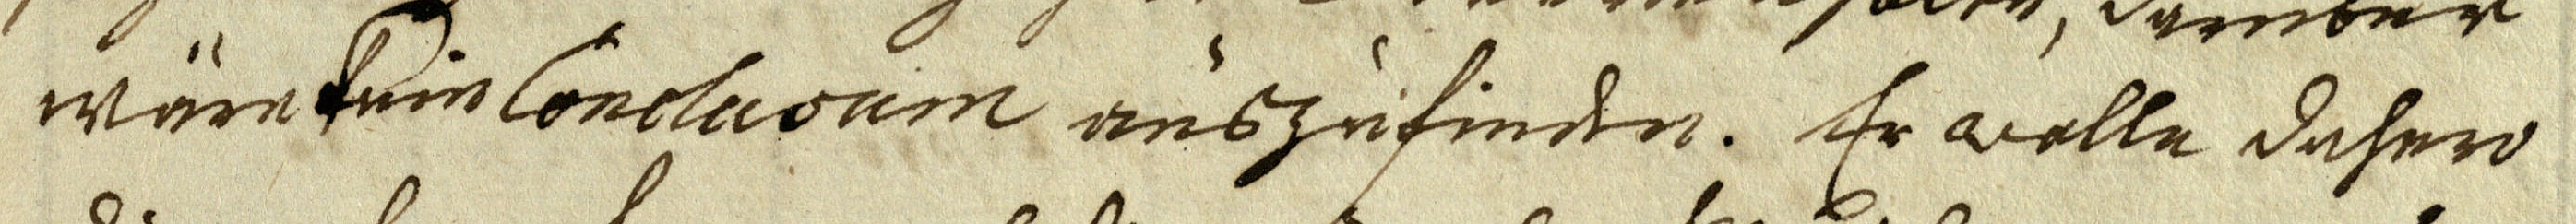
wäre kein Conclusum auszufinden. Er wolle dahero
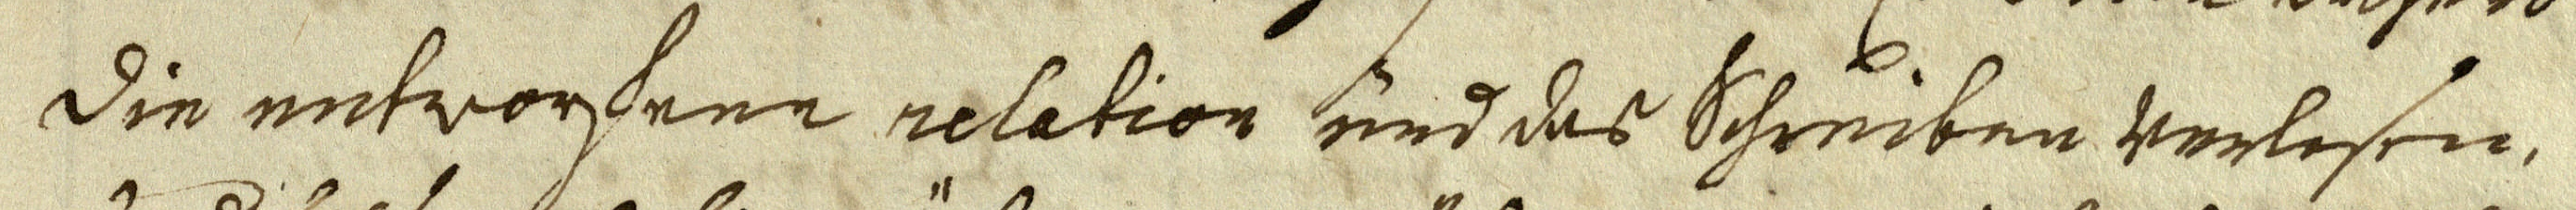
die entworfene relation und das Schreiben verlesen,
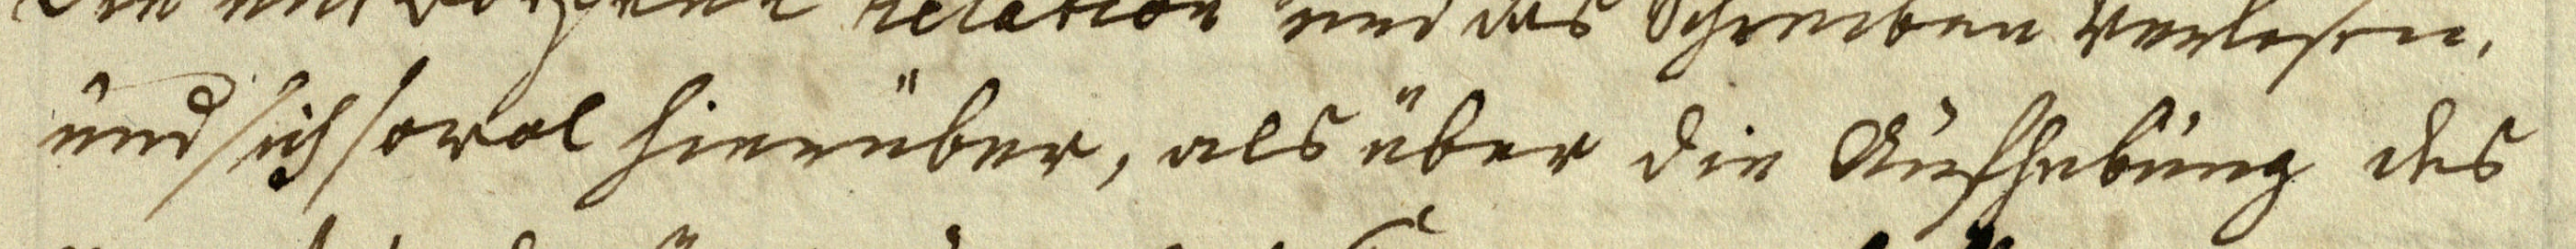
und sich sowol hierüber, als über die Aufhebung des
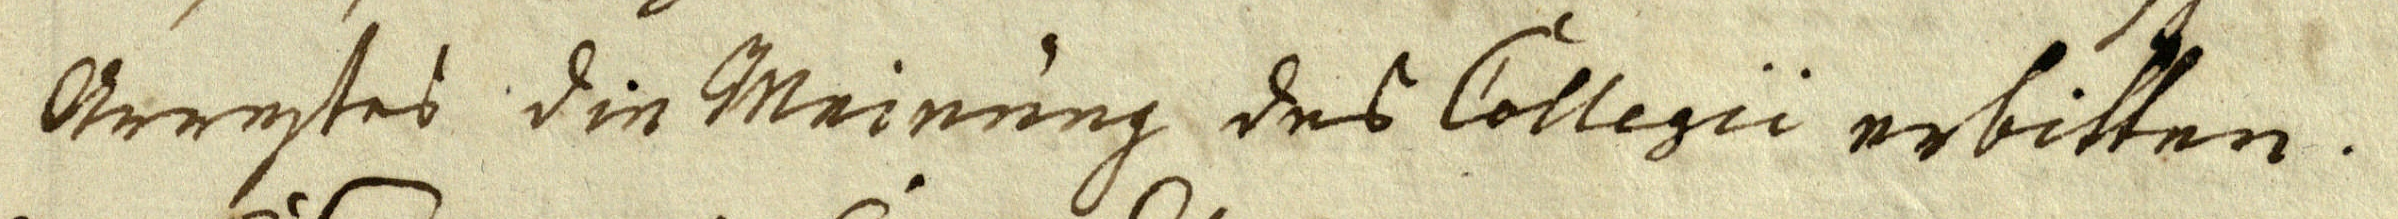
Arrestes die Meinung des Collegii erbitten.
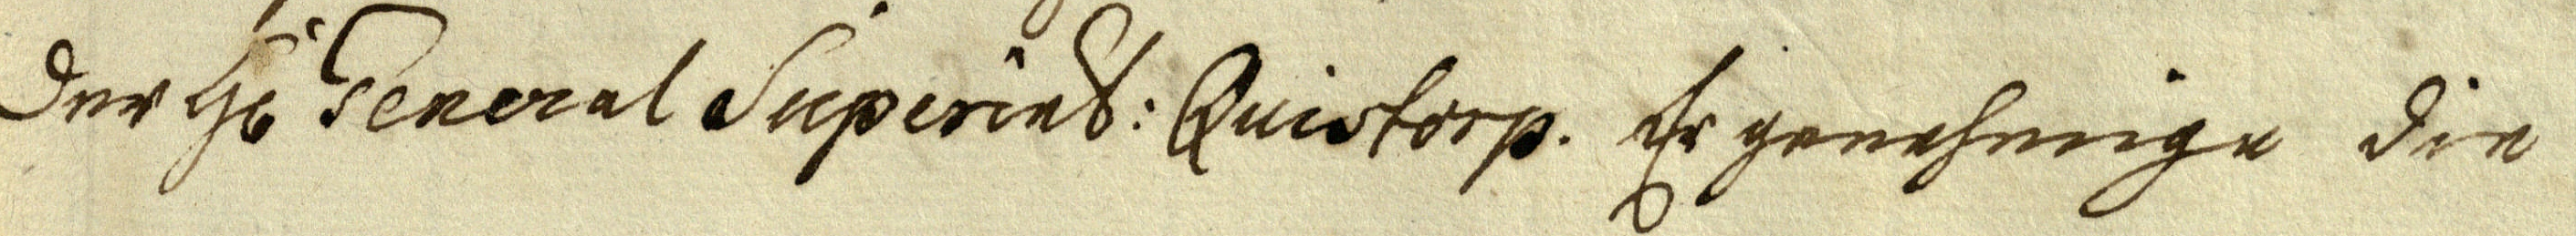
Der H. General Superint. Quistorp. Er genehmige die
